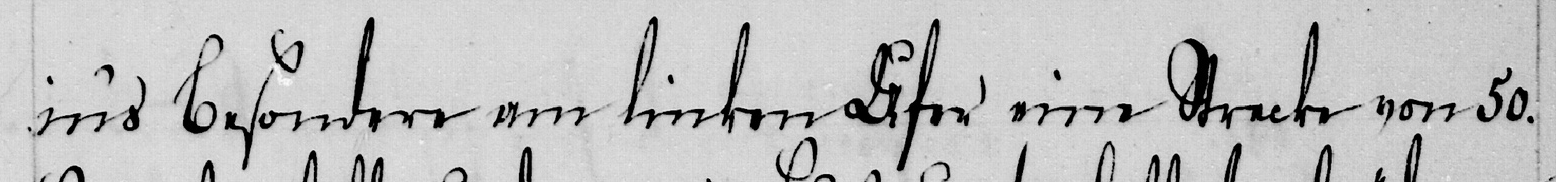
ins Besondere am linken Ufer eine Strecke von 50.
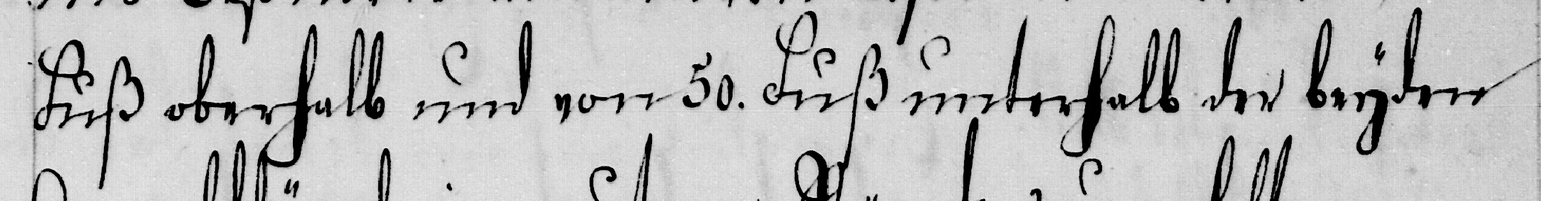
Fuß oberhalb und von 50. Fuß unterhalb der beyden
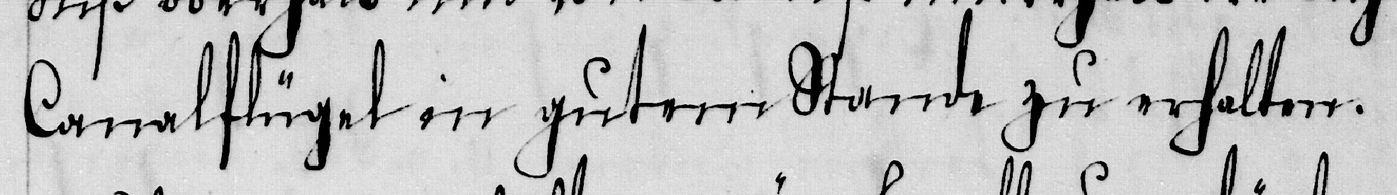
Canalflügel in gutem Stande zu erhalten.
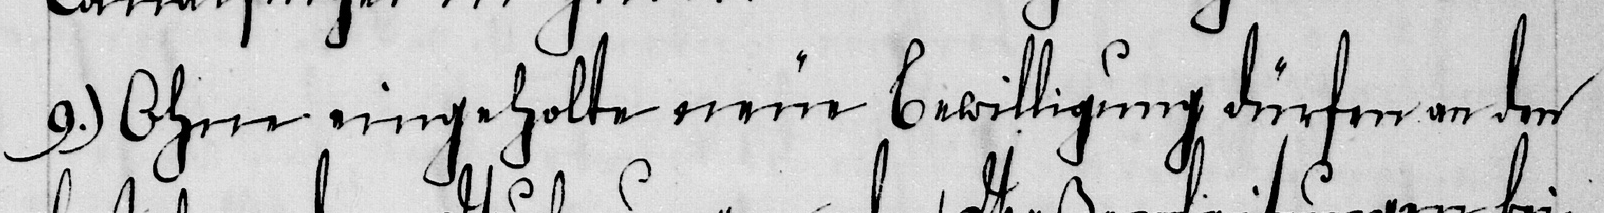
9.) Ohne eingeholte neue Bewilligung dürfen an den
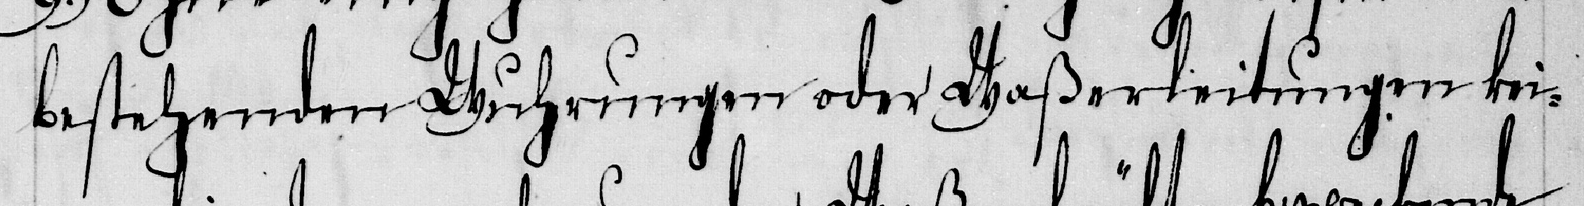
bestehenden Wuhrungen oder Waßerleitungen kei¬
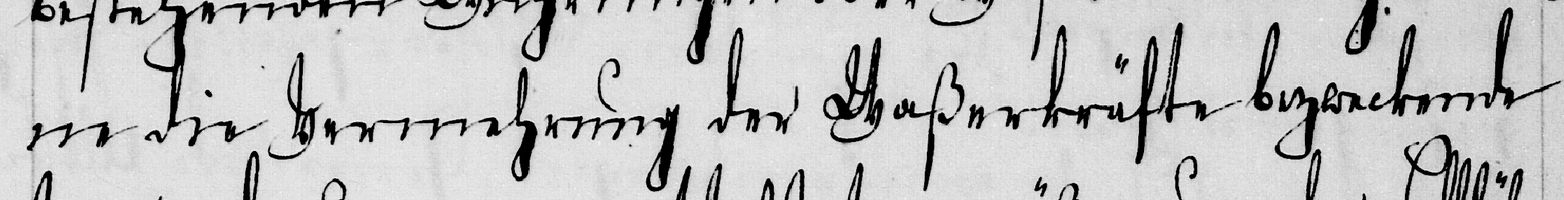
ne die Vermehrung der Waßerkräfte bezweckende
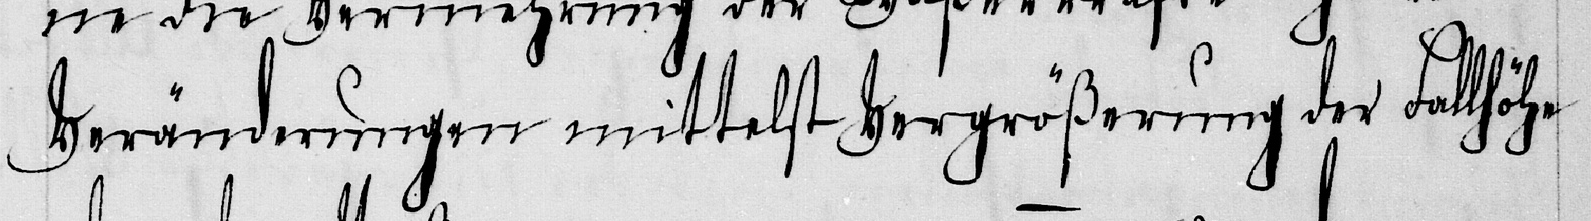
Veränderungen mittelst Vergrößerung der Fallhöhe
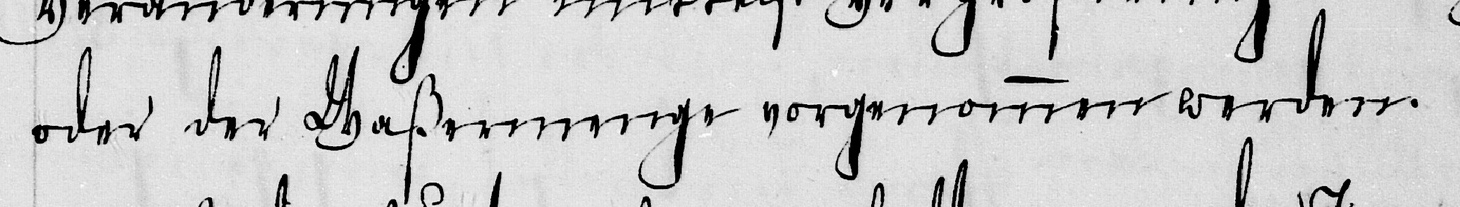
oder der Waßermenge vorgenommen werden.
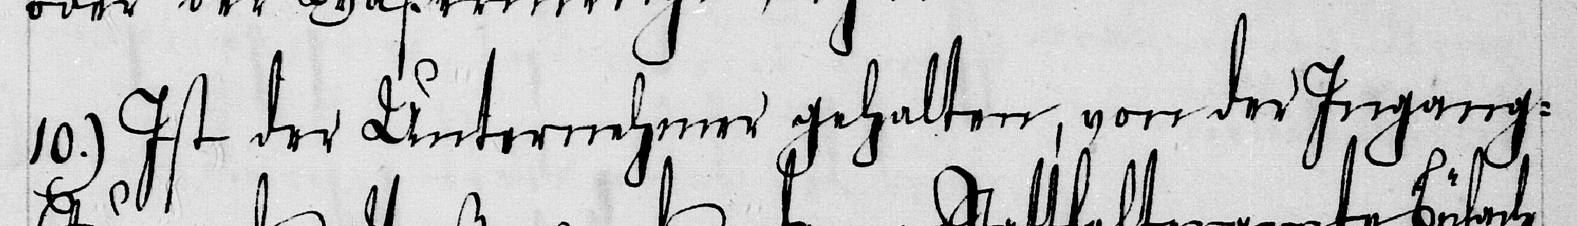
10.) Ist der Unternehmer gehalten, von der Ingang¬
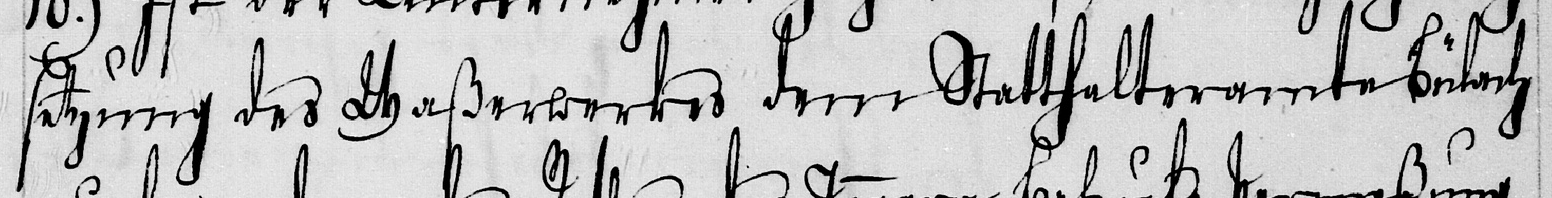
setzung des Waßerwerkes dem Statthalteramte Bülach
